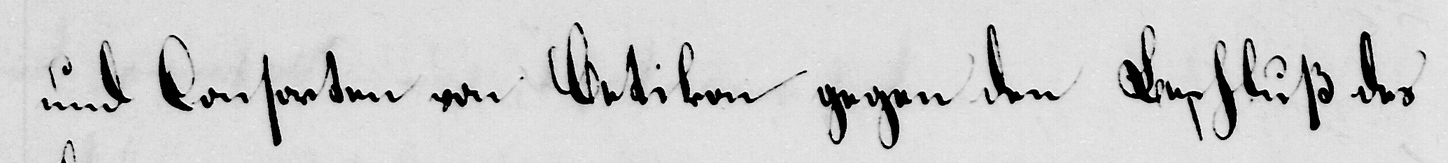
und Consorten von Oetikon gegen den Beschluß des
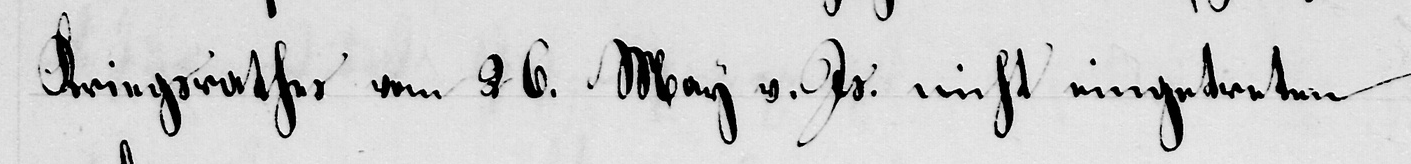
Kriegsrathes vom 26. May v. Js. nicht eingetreten
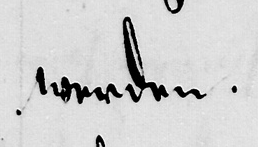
werden.
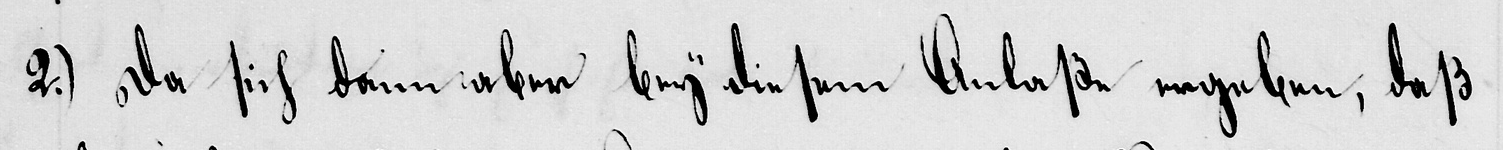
2.) Da sich dann aber bey diesem Anlaße ergeben, daß
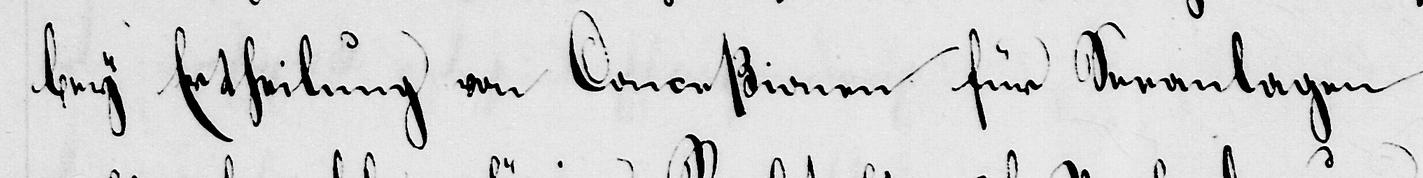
bey Ertheilung von Conceßionen für Seeanlagen
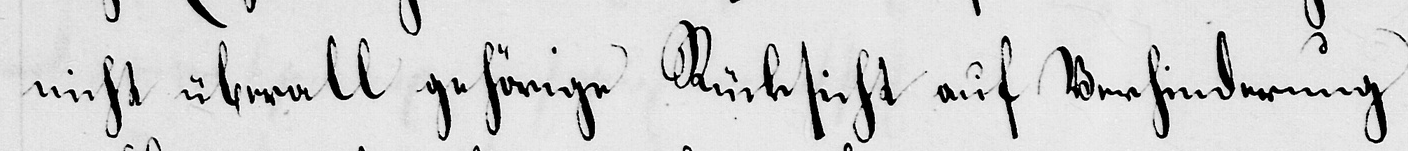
nicht überall gehörige Rücksicht auf Verhinderung
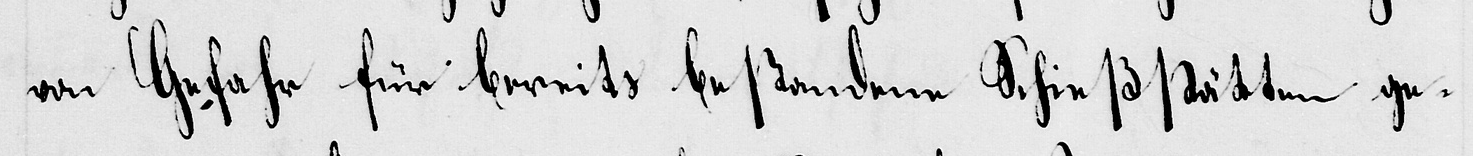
von Gefahr für bereits bestandene Schießstätten ge¬
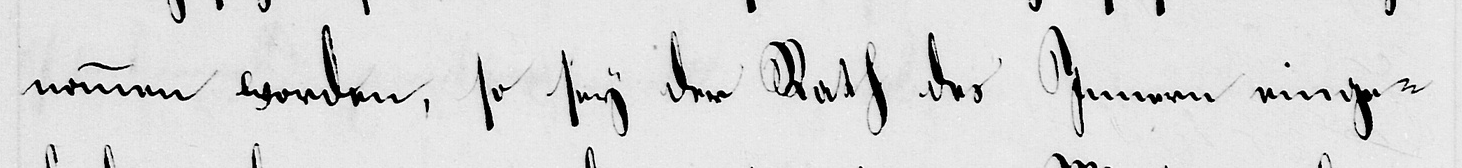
nommen worden, so sey der Rath des Innern einge¬
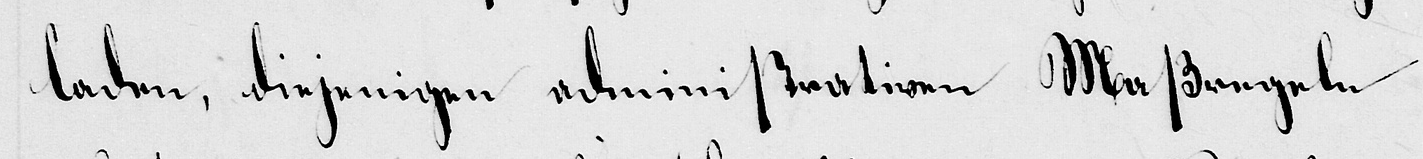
laden, diejenigen administrativen Maßregeln
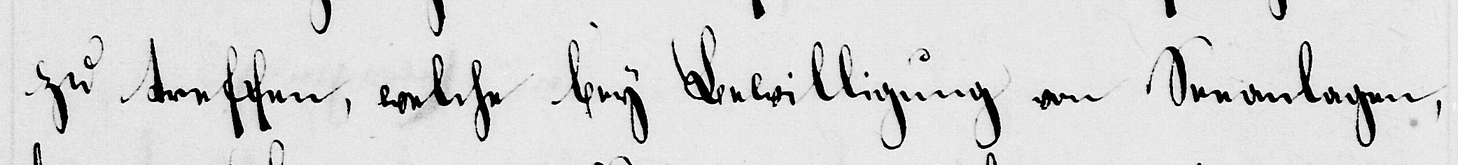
zu treffen, welche bey Bewilligung von Seeanlagen,
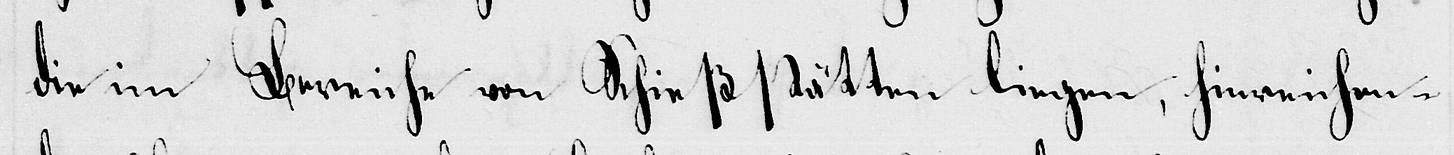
die im Bereiche von Schießstätten liegen, hinreichen¬
